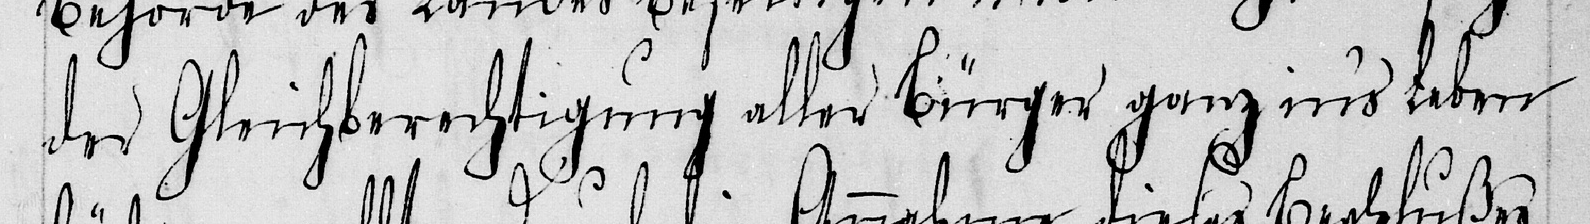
der Gleichberechtigung aller Bürger ganz ins Leben
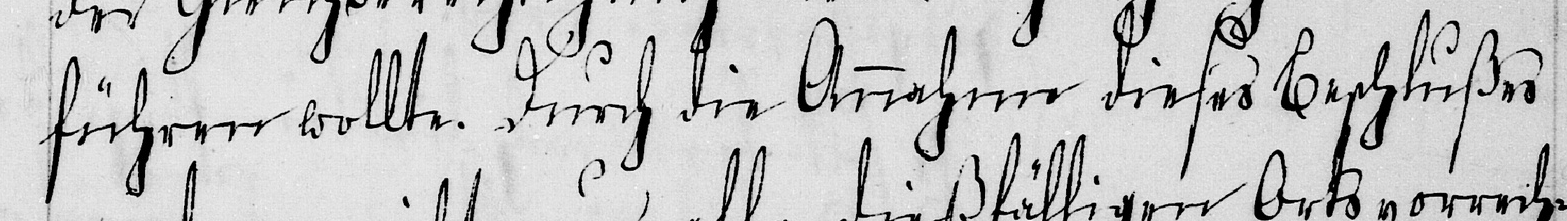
führen wollte. Durch die Annahme dieses Beschlußes
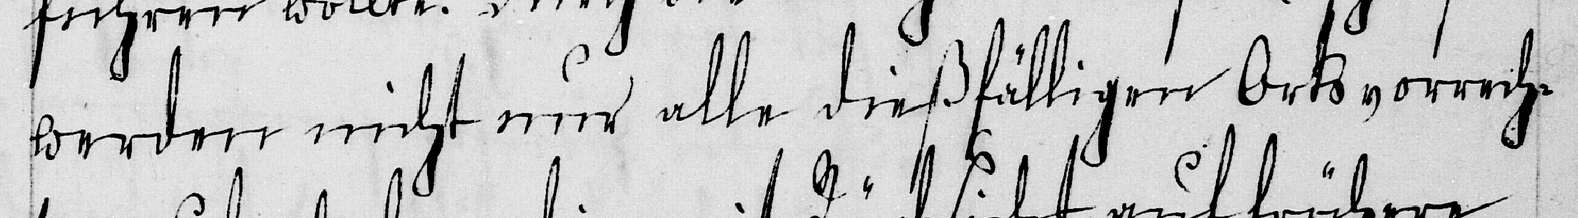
werden nicht nur alle dießfälligen Ortsvorrech¬
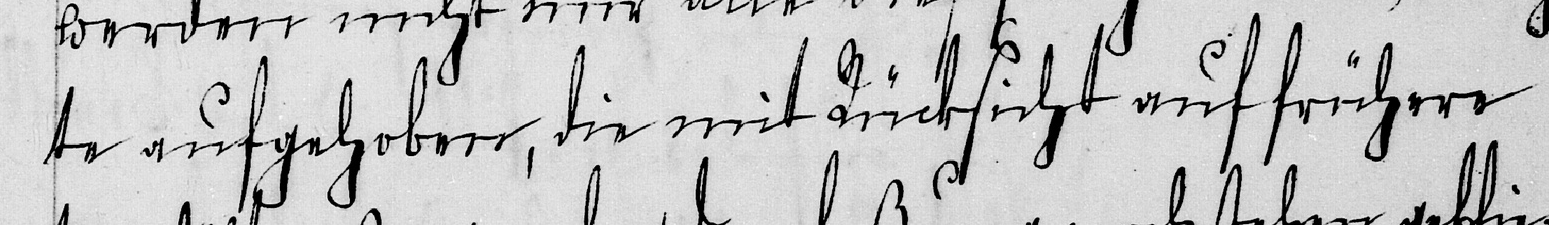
te aufgehoben, die mit Rücksicht auf frühere
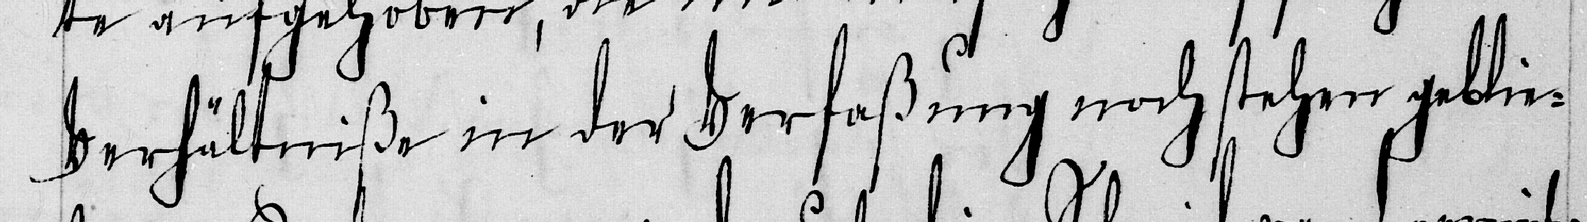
Verhältniße in der Verfaßung noch stehen geblie¬
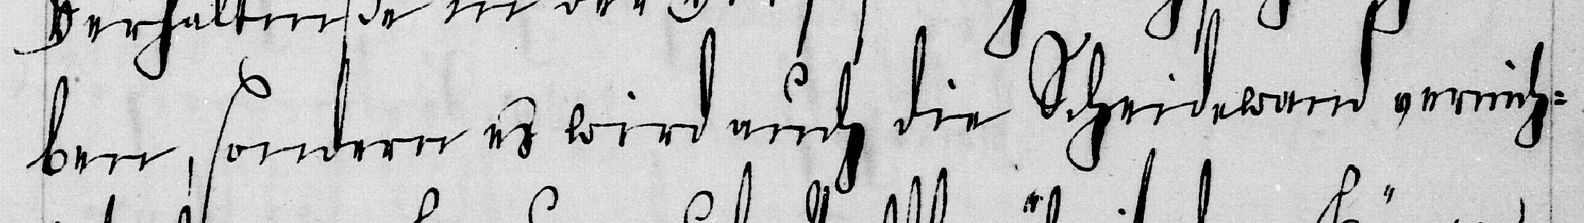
ben, sondern es wird auch die Scheidewand vernich¬
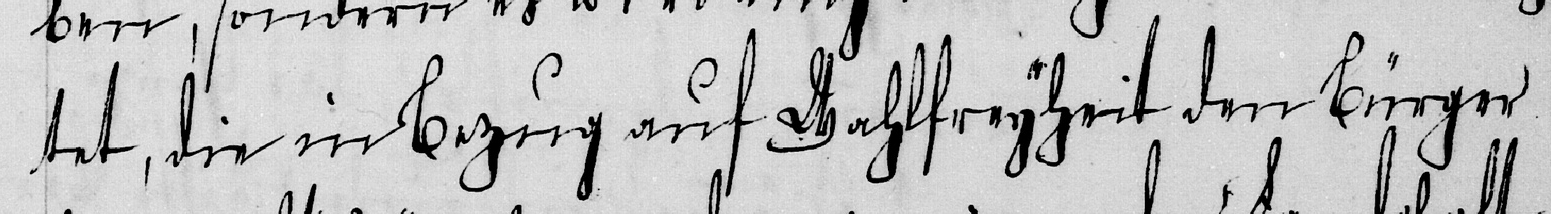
tet, die in Bezug auf Wahlfreyheit den Bürger
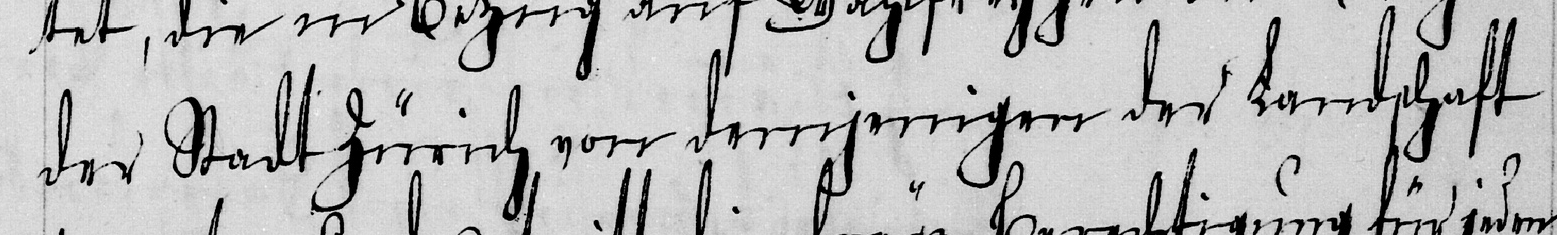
der Stadt Zürich von demjenigen der Landschaft
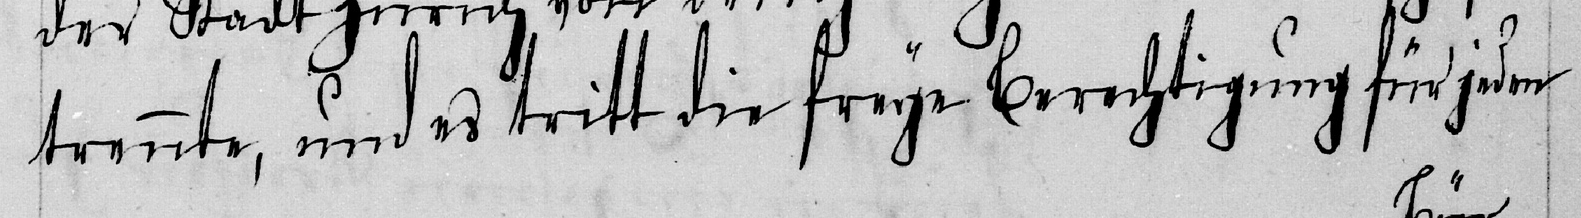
trennte, und es tritt die freye Berechtigung für jeden
